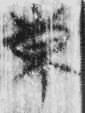東
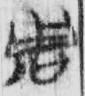周
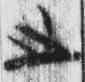之
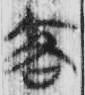客
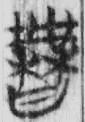○（許）
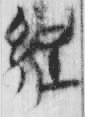○（盈）
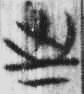至（致）
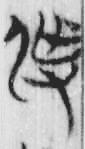{尸拃}（胙）
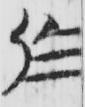於
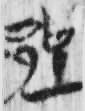郢
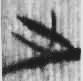之
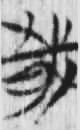歲（歲）
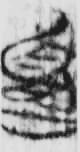○（夏）
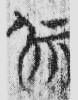𫵖
